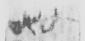卅
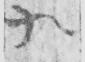九
